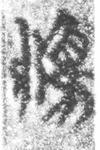糗
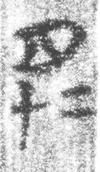四十
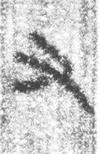又
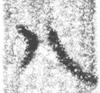八
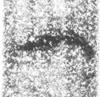一
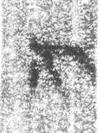大
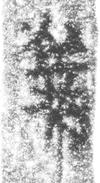襄（囊）
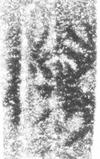糗
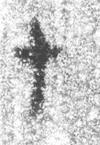十
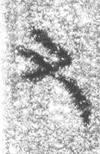又
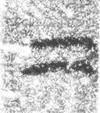二
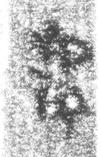襄（囊）
